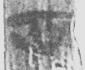百
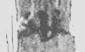卅
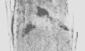六
